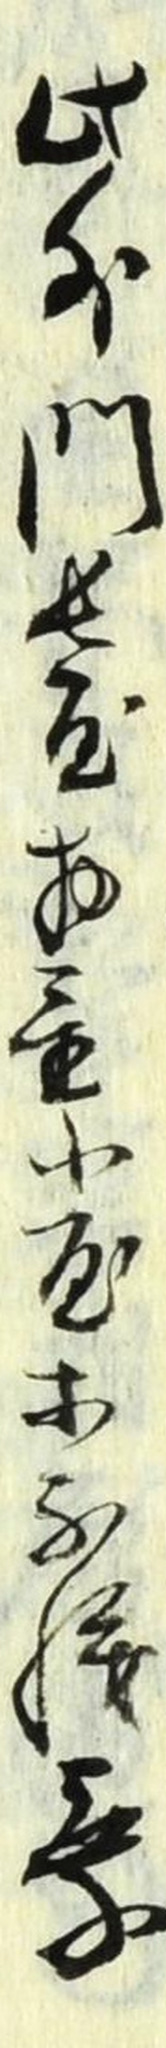此外門長屋物置小屋等不残乗
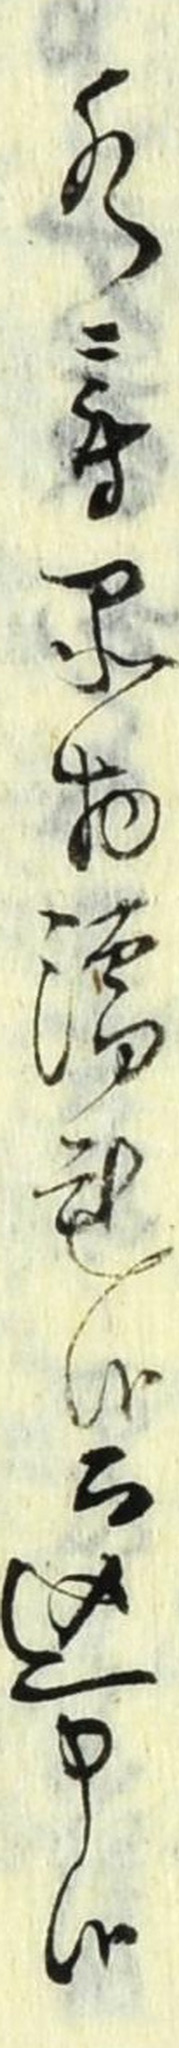水に付品物濡れ候而込申候
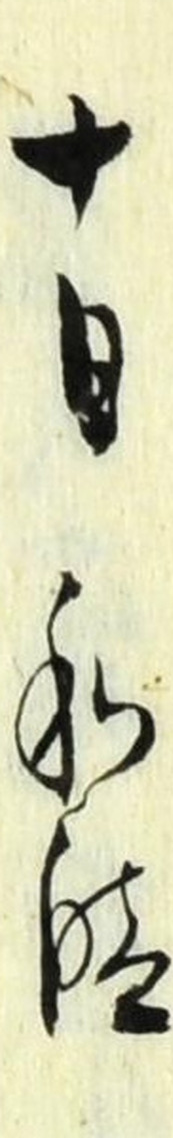十日和晴
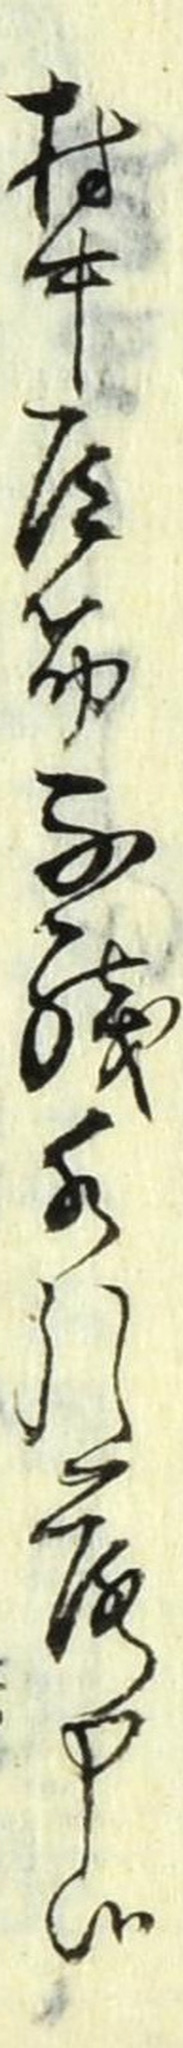村中道筋不残水引落申候
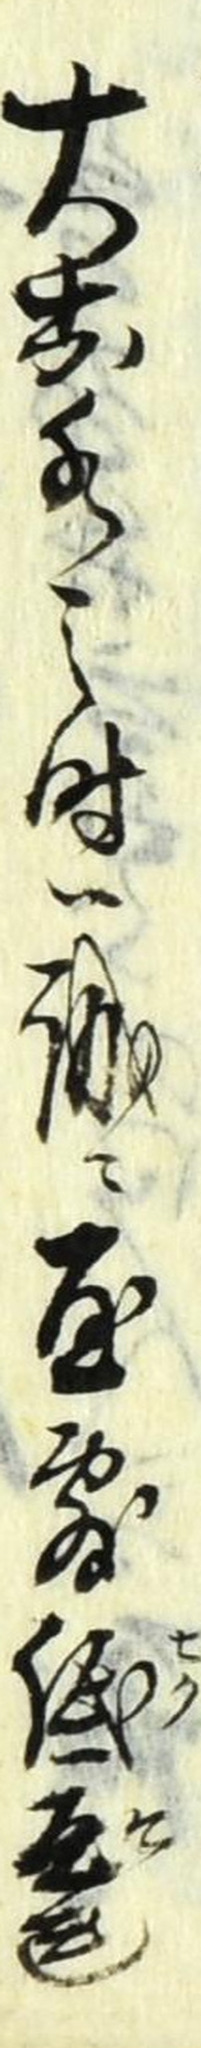大出水之時は誠に屋敷低れ
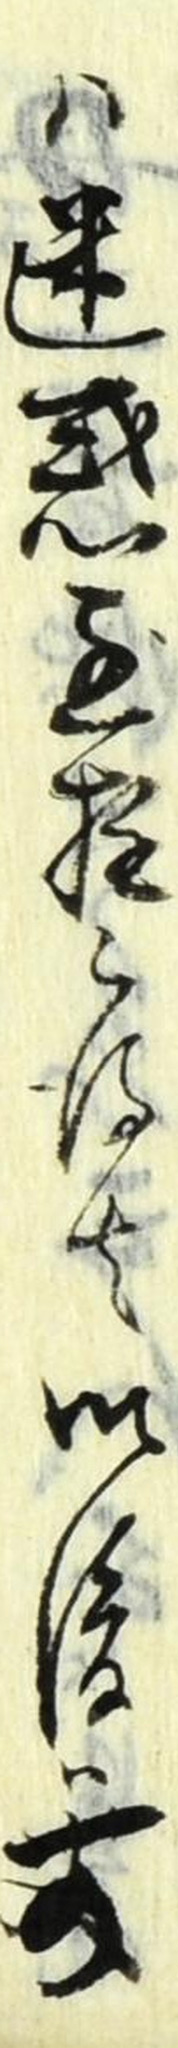は迷惑至極候得は以後は可
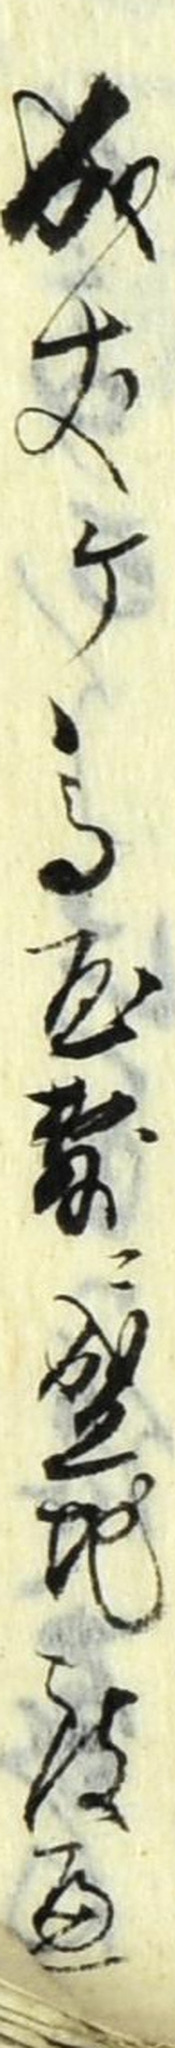成丈ヶ高屋敷に盛地致へ

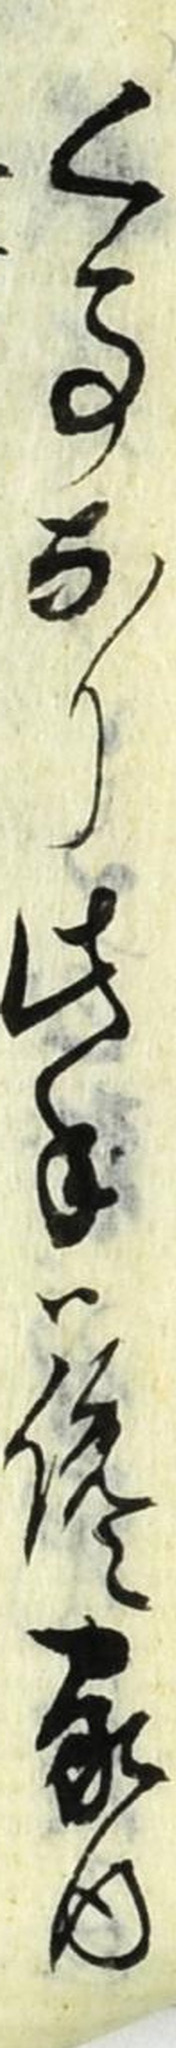く事なり此手は纔家内
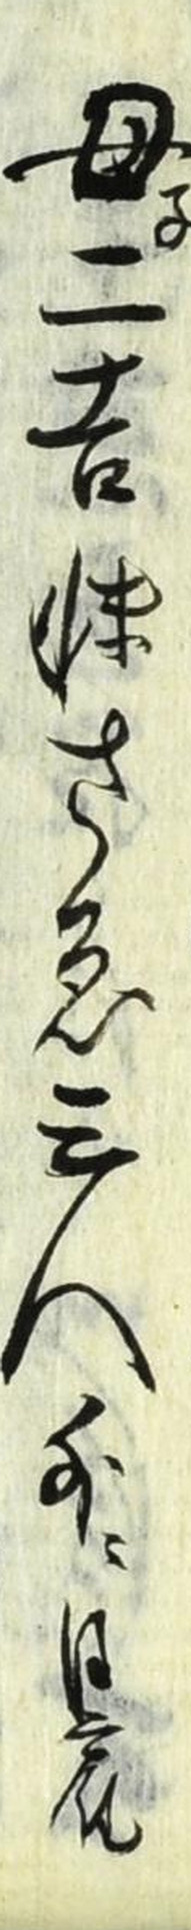母子二吉妹さゑ三人外に日雇
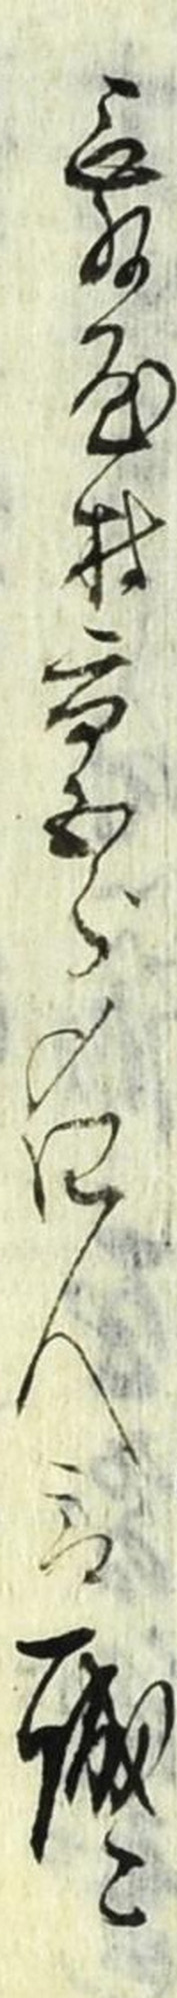舞屋村市五郎〆四人に而誠に
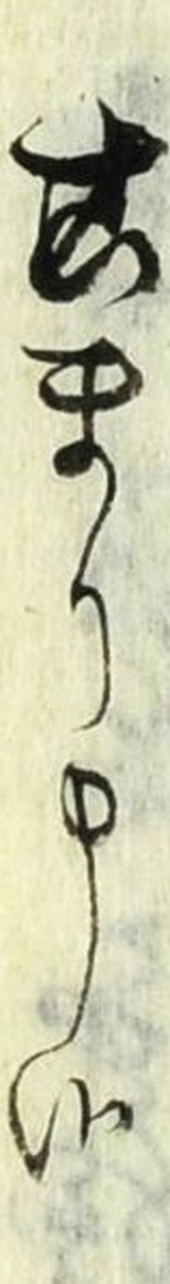こまり申候
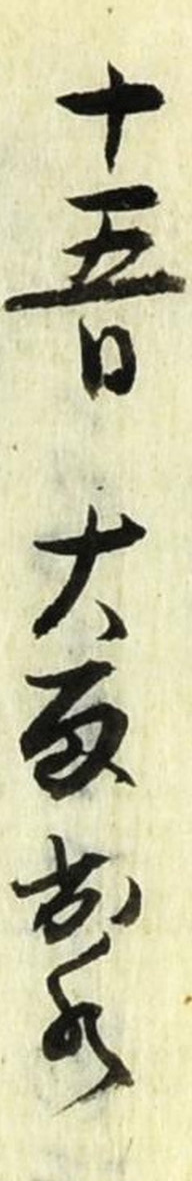十五日大雨出水
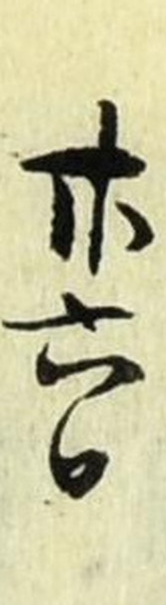廿六日
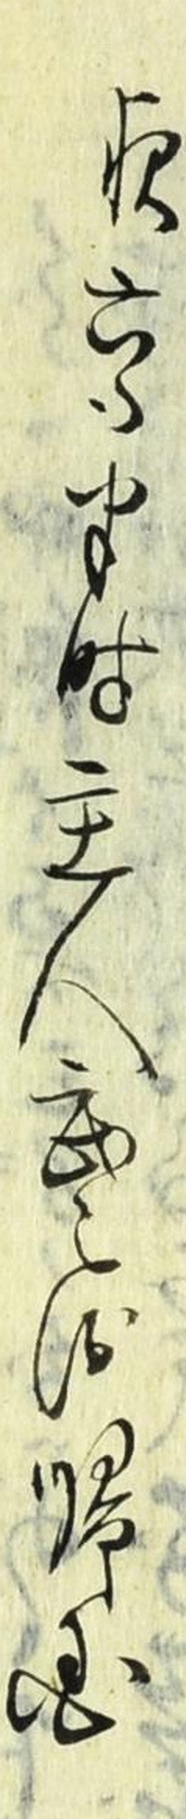夜六ツ半時主人武兵衛帰国

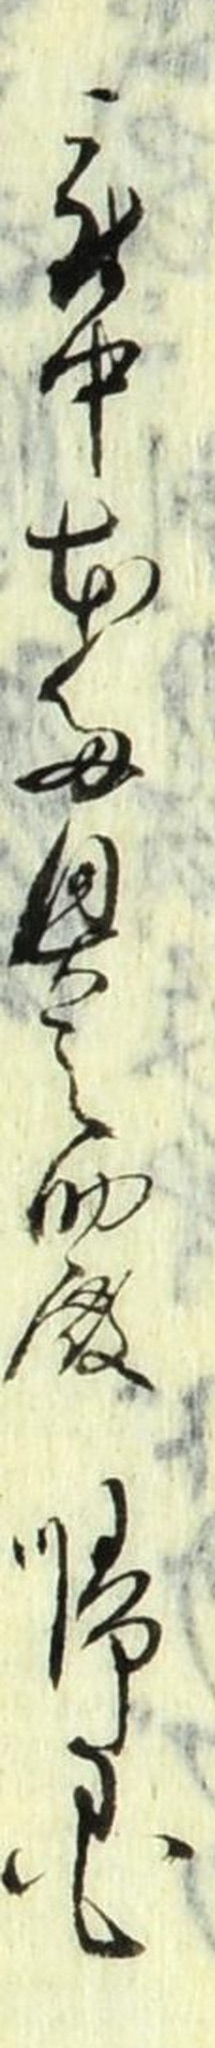府中本多興之助殿帰国
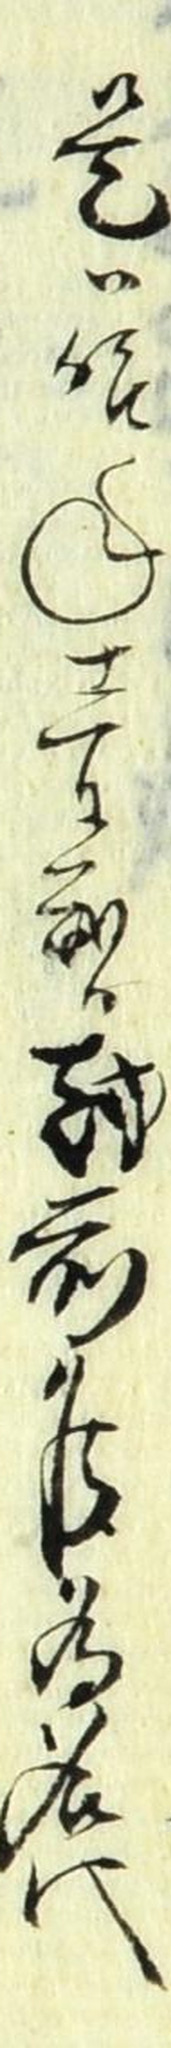是は昨年十二月朔日越前侯為名代
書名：（日記）
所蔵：福井県文書館 Fukui Prefectural Archives
